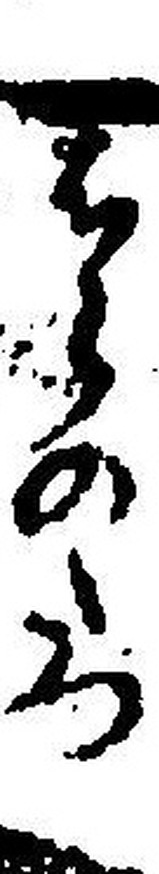はらのたつ
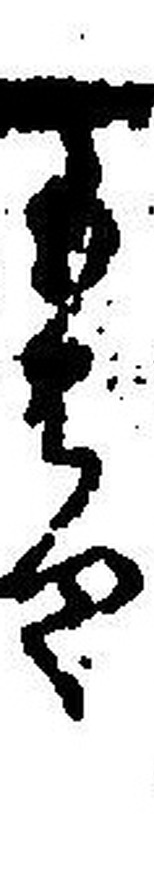もはや
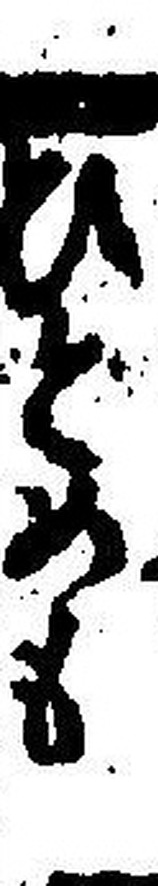ひとめも
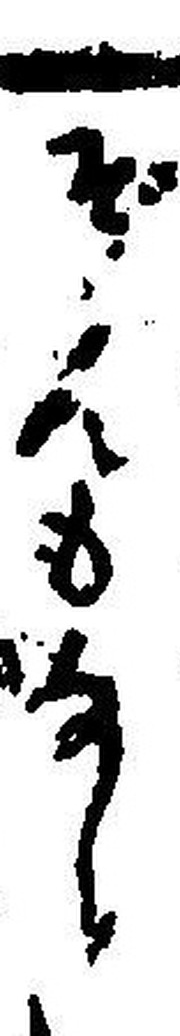ぞんもなし
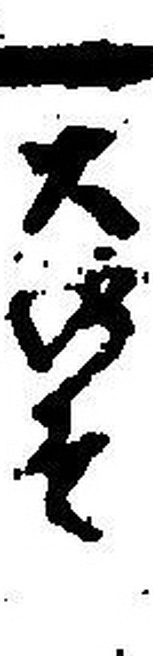大いそ
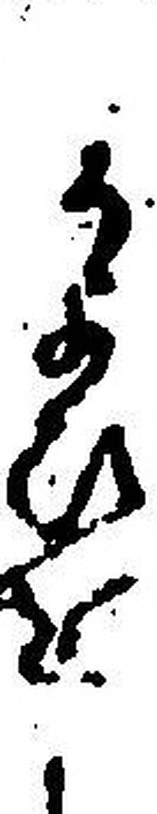かよひを
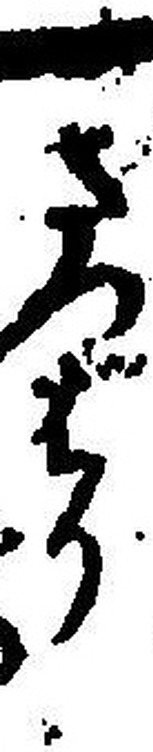さつはり
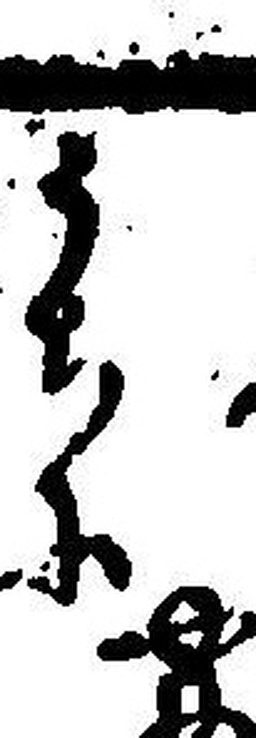うちに
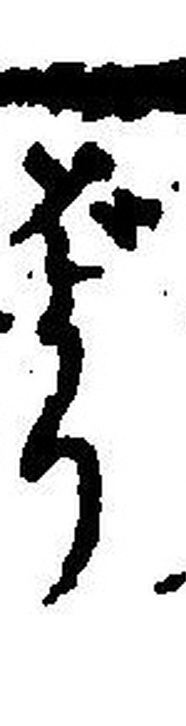ばかり
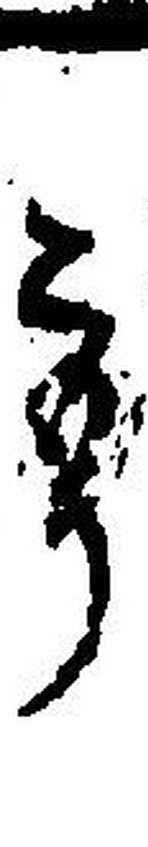こもり
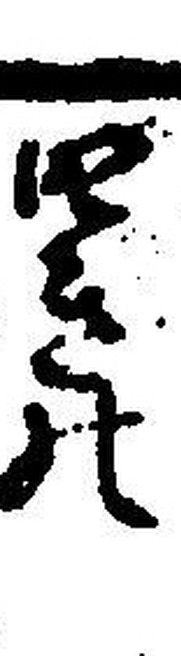四きの
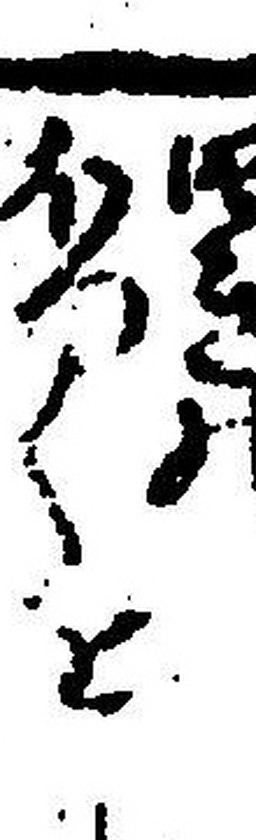ほつくを
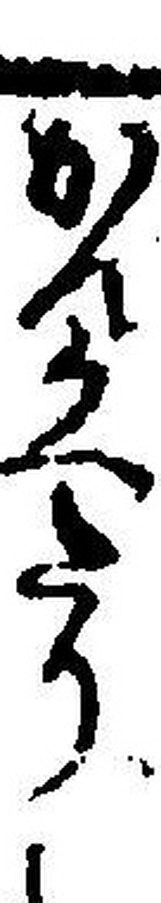かんかへたり
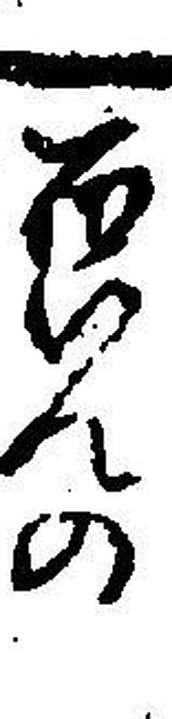百いんの
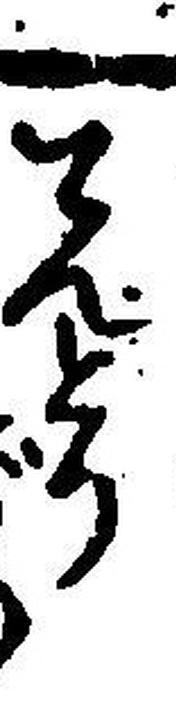てんとり
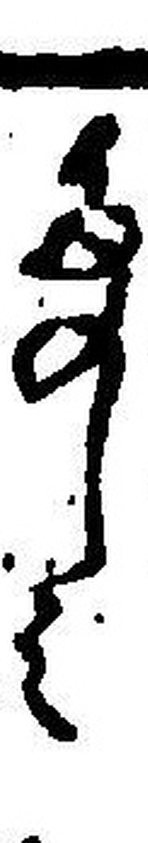たのしみ
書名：御代参牛時詣 / 市場通笑作
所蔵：東京大学総合図書館 General Library in the University of Tokyo, JAPAN
